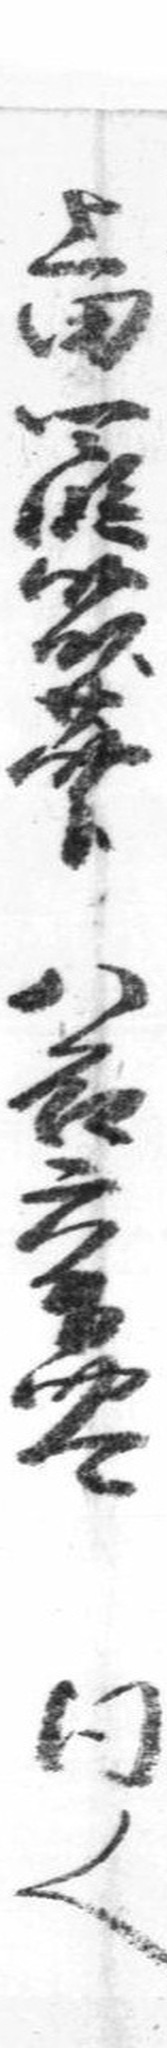上田四段四畝廿四分八石六升四合同人
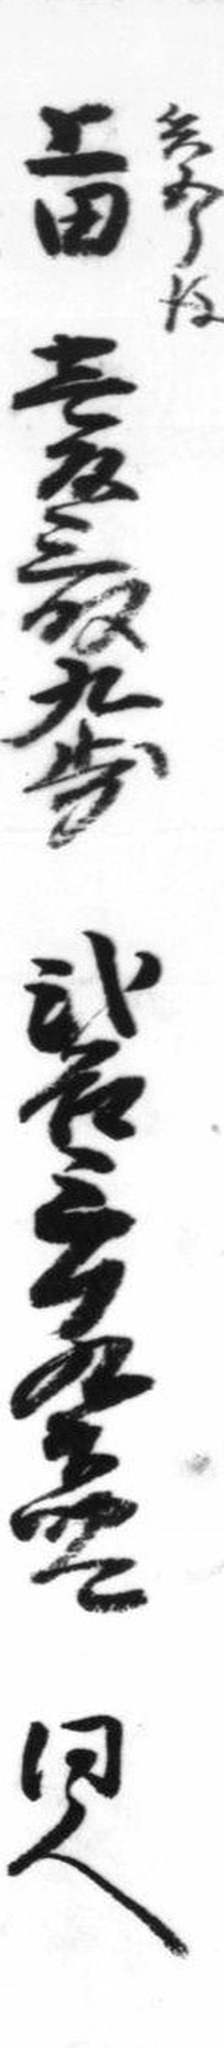上田壱反三畝九歩弐石三斗九升四合同人
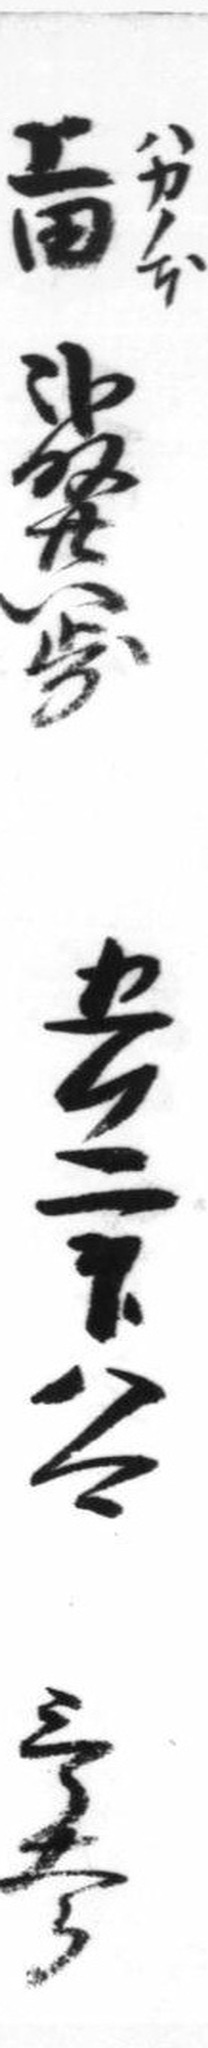上田弐畝廿八歩五斗二升八合三郎太郎
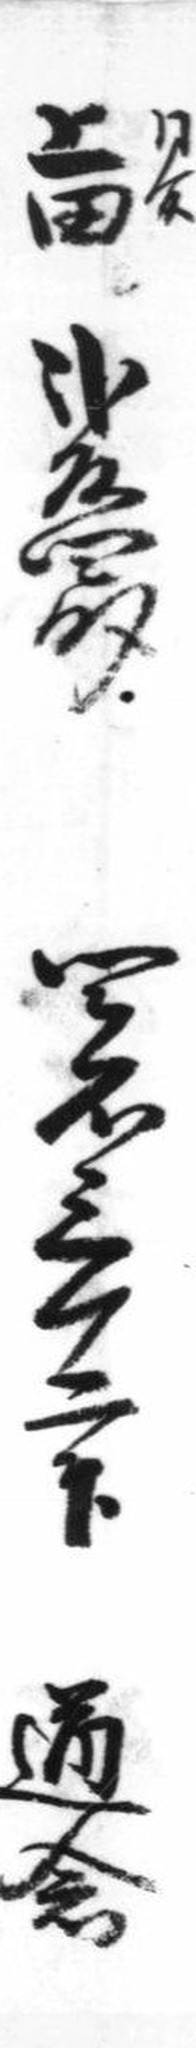上田弐反四畝四石三斗二升道念
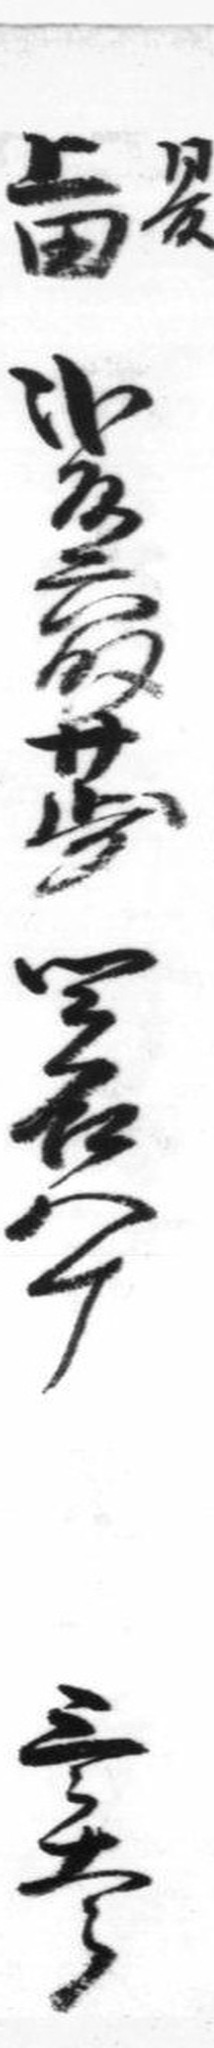上田弐反六畝廿歩四石八斗三郎太郎
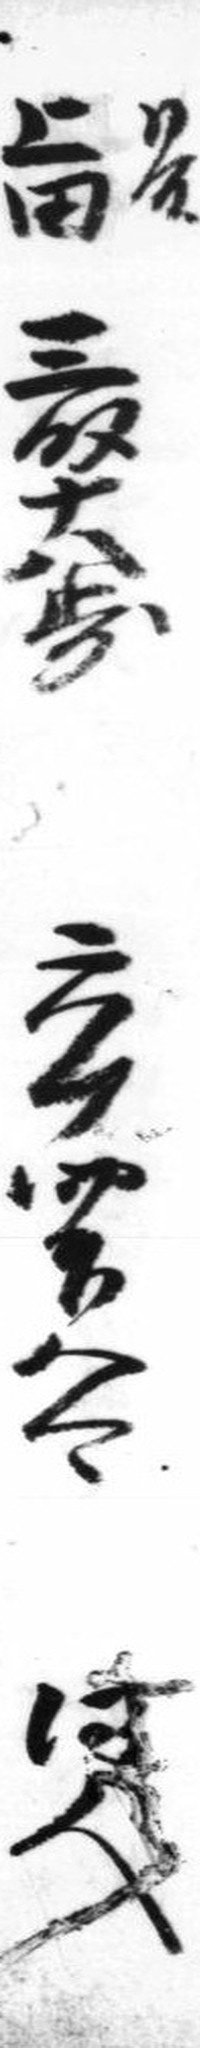上田三畝十八歩六斗四升八合同人
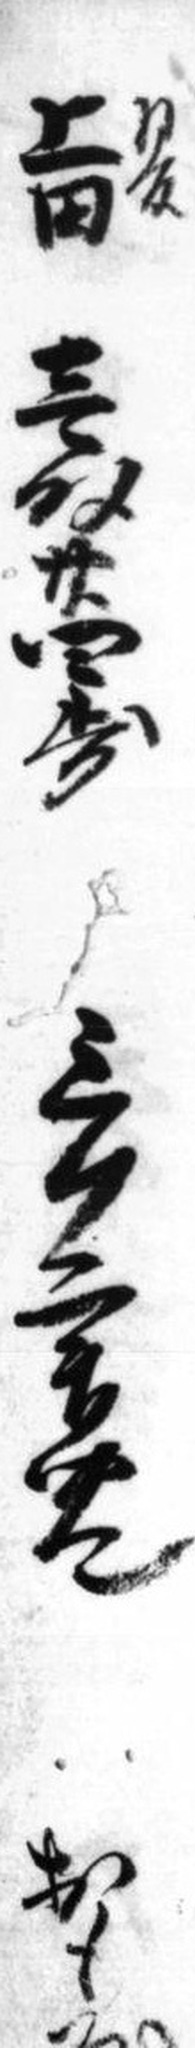上田壱畝廿四歩三斗二升四合出〆屋

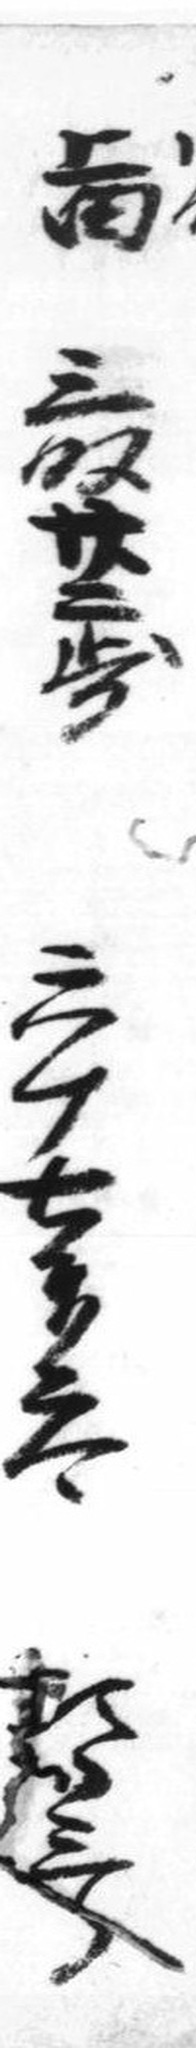上田三畝廿二歩六斗七升二合次郎三郎
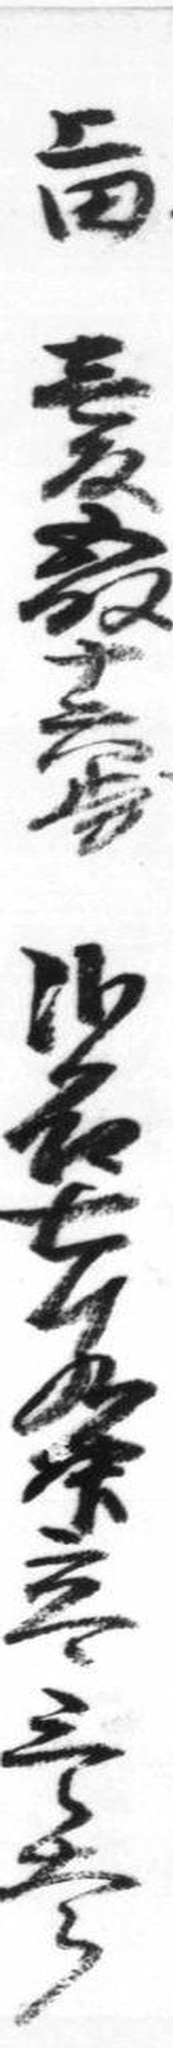上田壱反五畝十六歩弐石七斗九升六合三郎太郎
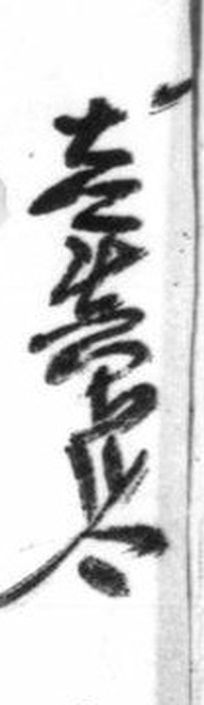壱斗六升弐合
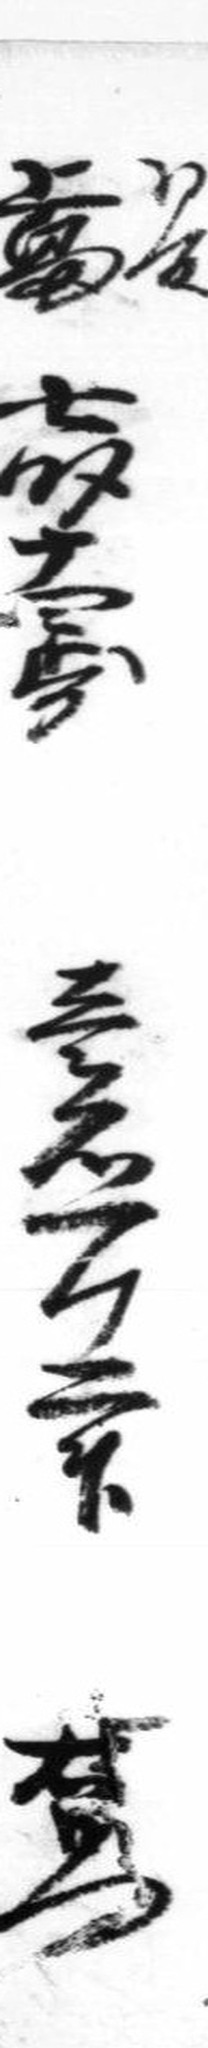上畠七畝十四歩壱石一斗二升右衛門

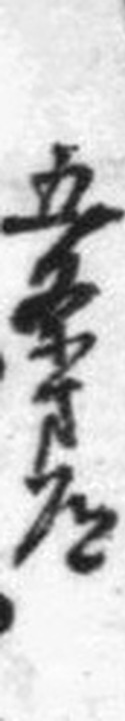五条方道
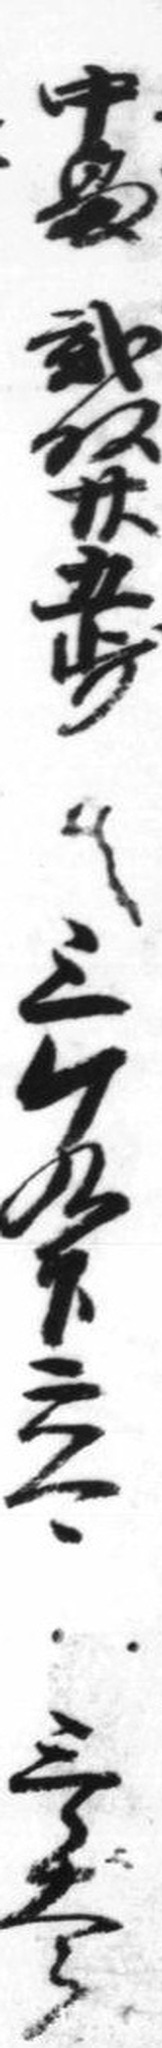中畠弐畝廿五歩三斗九升六合三郎太郎
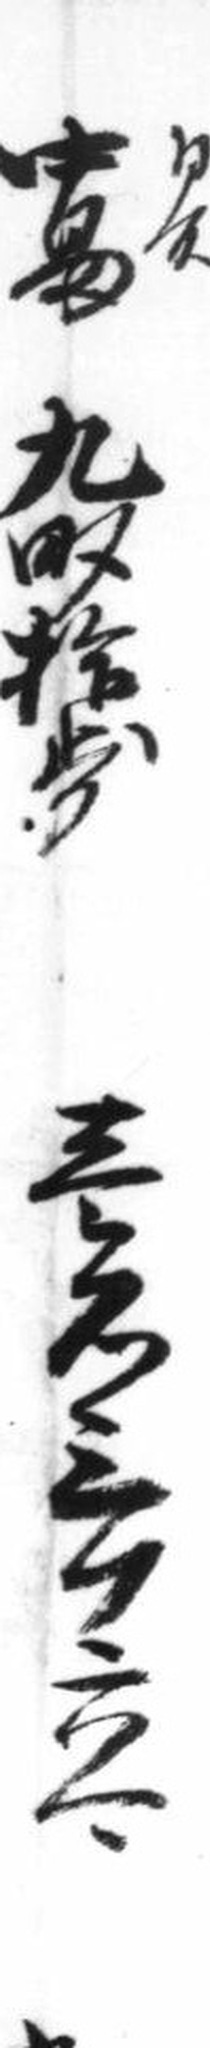中畠九畝拾歩壱石三斗六合常念
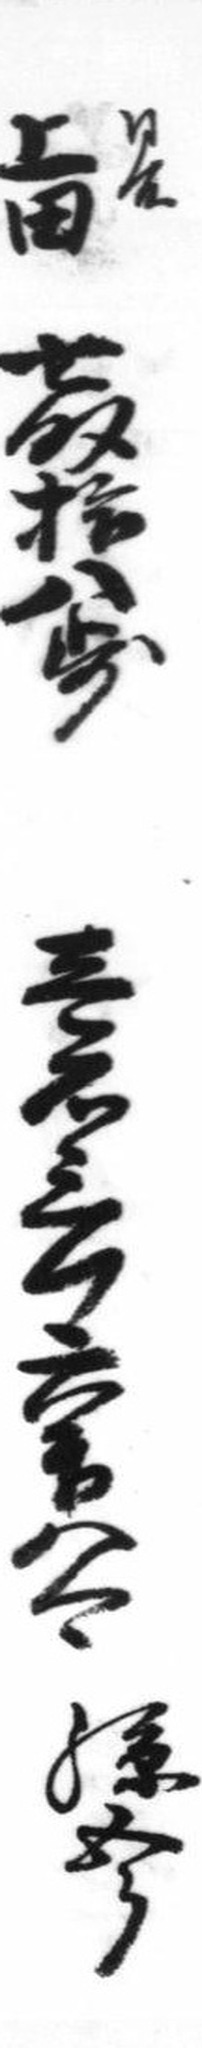上田七畝拾八歩壱石三斗六升八合孫五郎
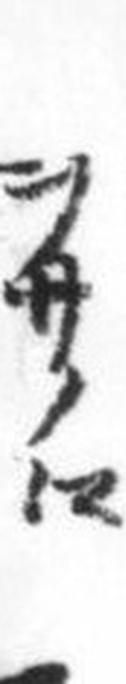ヲサノ口
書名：越前国大野郡今井村御検地帳
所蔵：福井県文書館 Fukui Prefectural Archives
